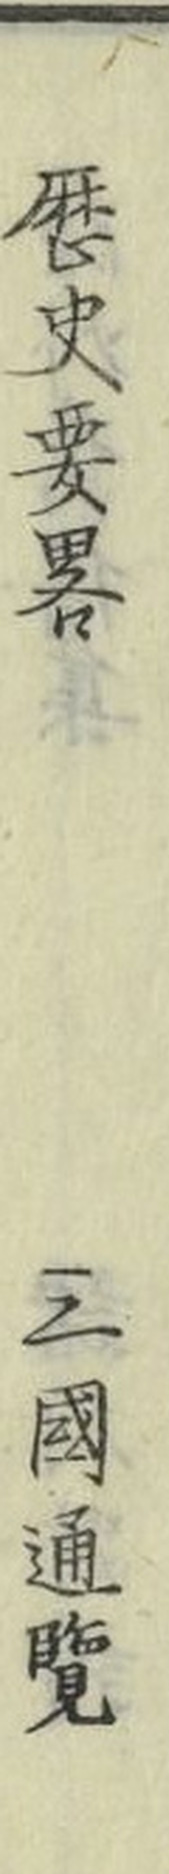歴史要略三国通覧
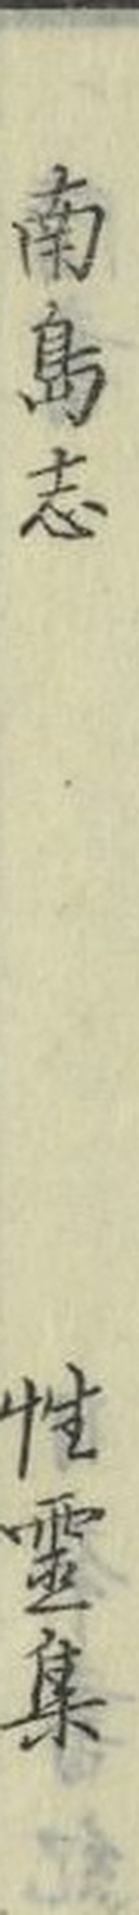南島志性霊集

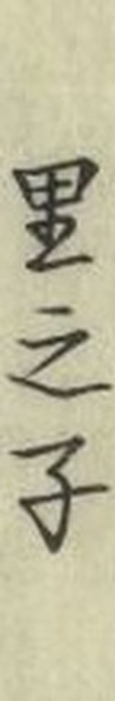里之子
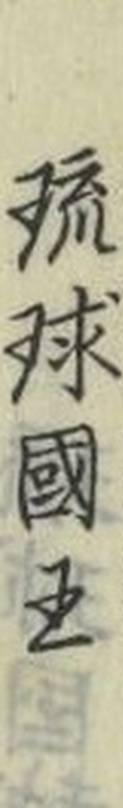琉球国王

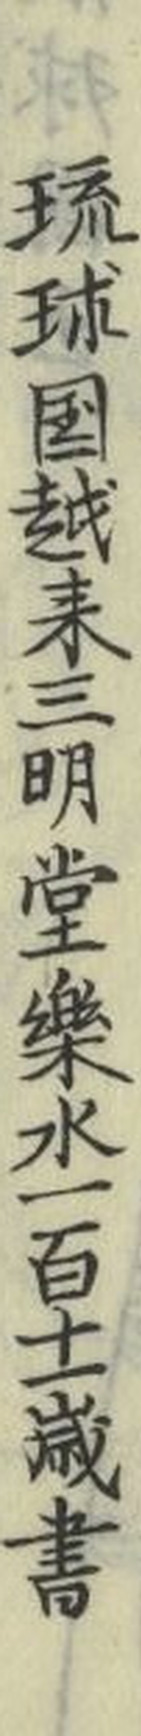琉球国越来三明堂楽水一百土歳書
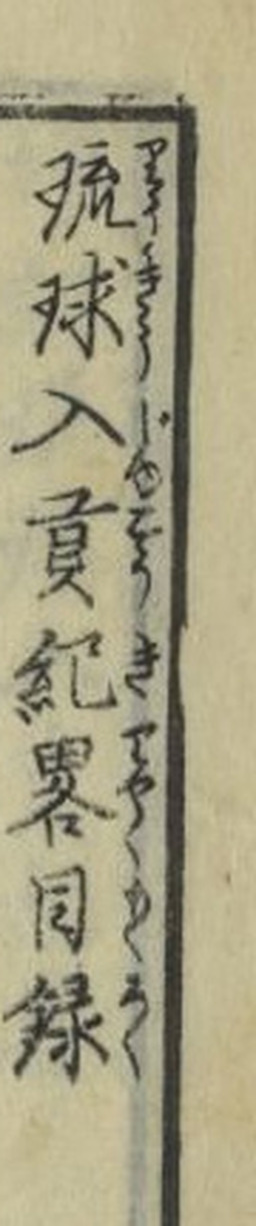琉球入貢紀略目録
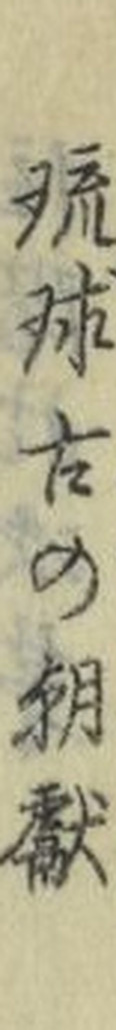琉球古の朝獻
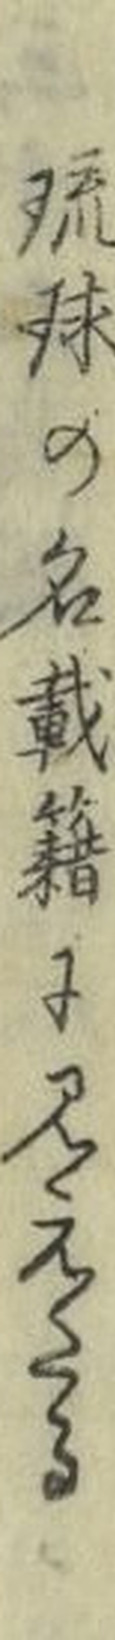琉球の名載籍よ見えくる
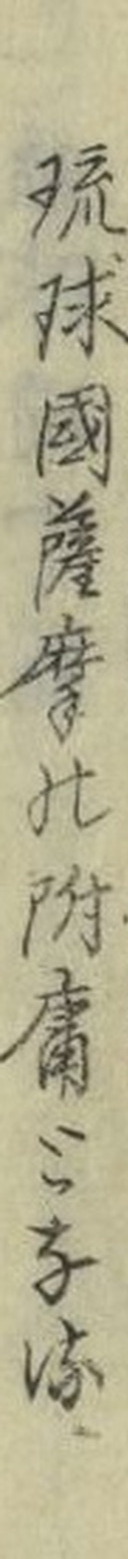琉球国薩摩の附庸らるる
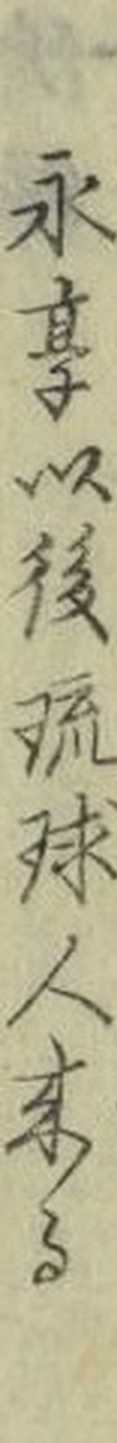永享以後琉球人来る
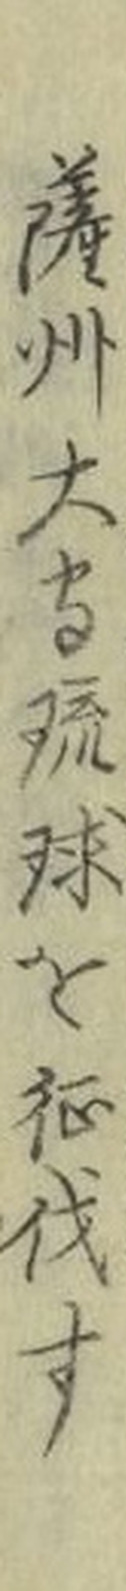薩州太守琉球を征伐す
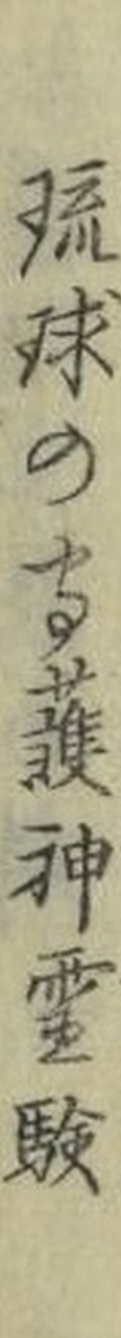琉球の守護神霊験

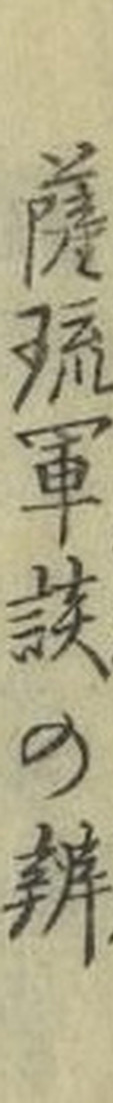薩琉軍談の弁
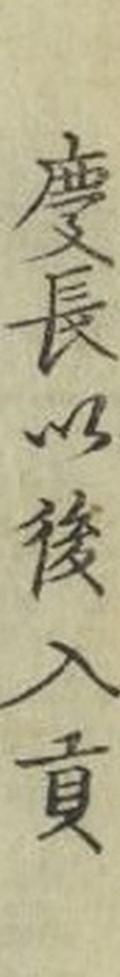慶長以後入貢
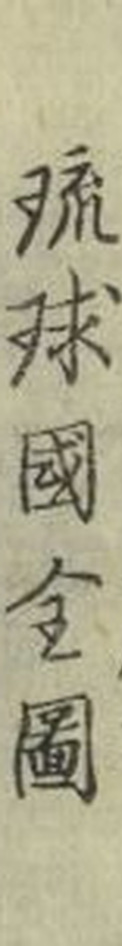琉球国全図
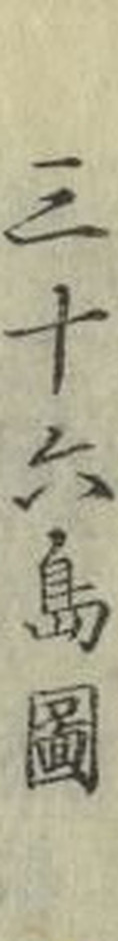三十六島図
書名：琉球入貢紀略
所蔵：University of the Ryukyus Library
